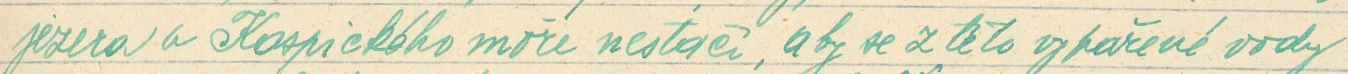jezera a Kaspického moře nestačí, aby se z této vypařené vody
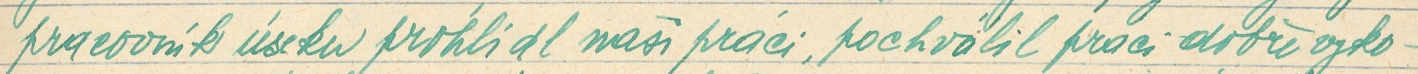pracovník úseku prohlídl naši práci, pochválil práci dobře vyko-
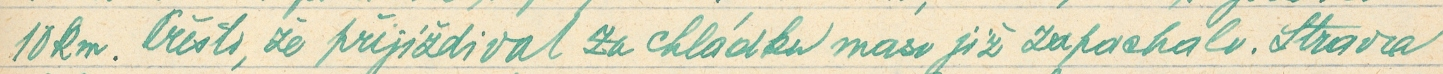10 km. Přesto, že přijíždival za chládku maso již zapachalo. Strava
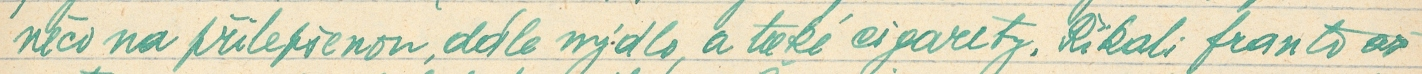něco na přilepšenou, dále mýdlo, a také cigarety. Říkali franto až
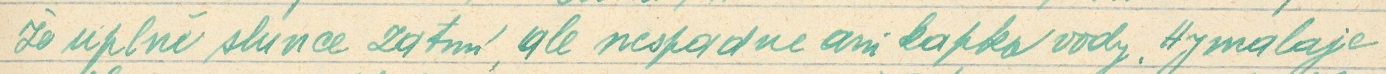že uplně slunce zatmí, ale nespadne ani kapka vody. Hymalaje
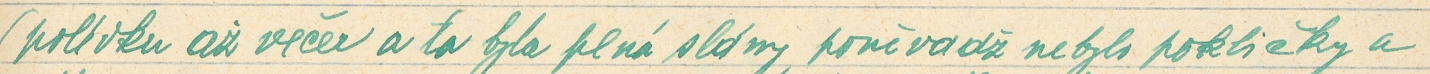(polévku až večer a ta byla plná slámy, poněvadž nebylo pokličky a
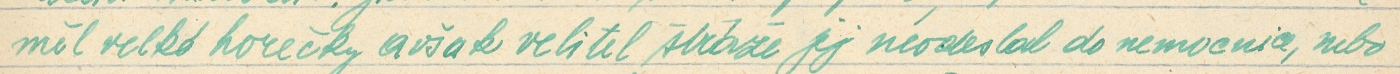měl velké horečky avšak velitel stráže jej neodeslal do nemocnice, nebo
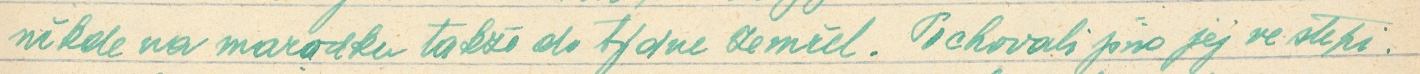někde na marodku takže do týdne zemřel. Pochovali jsme jej ve stepi.
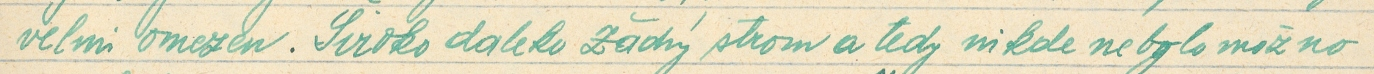velmi omezen. Široko daleko žadný strom a tedy nikde nebylo možno
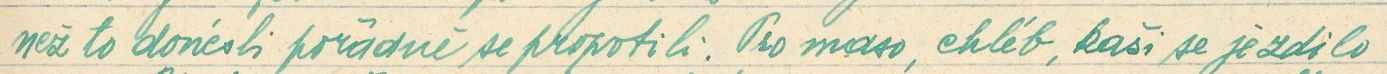než to donésli pořádně se propotili. Pro maso, chléb, kaši se jezdilo
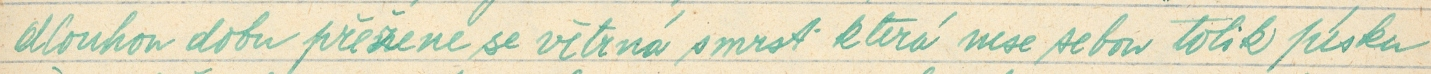dlouhou dobu přežene se větrná smrsť která nese sebou tolik písku
